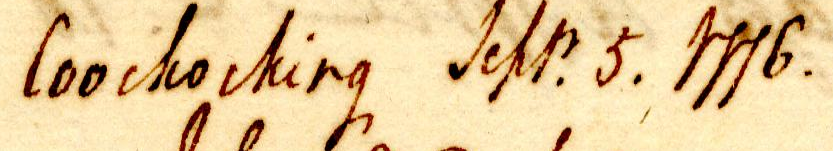Coochocking, Sept^r. 5. 1776.
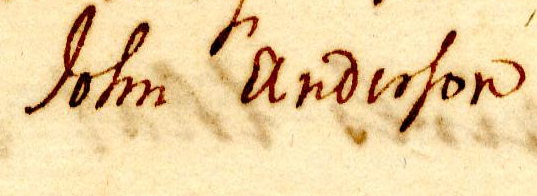John Anderson
